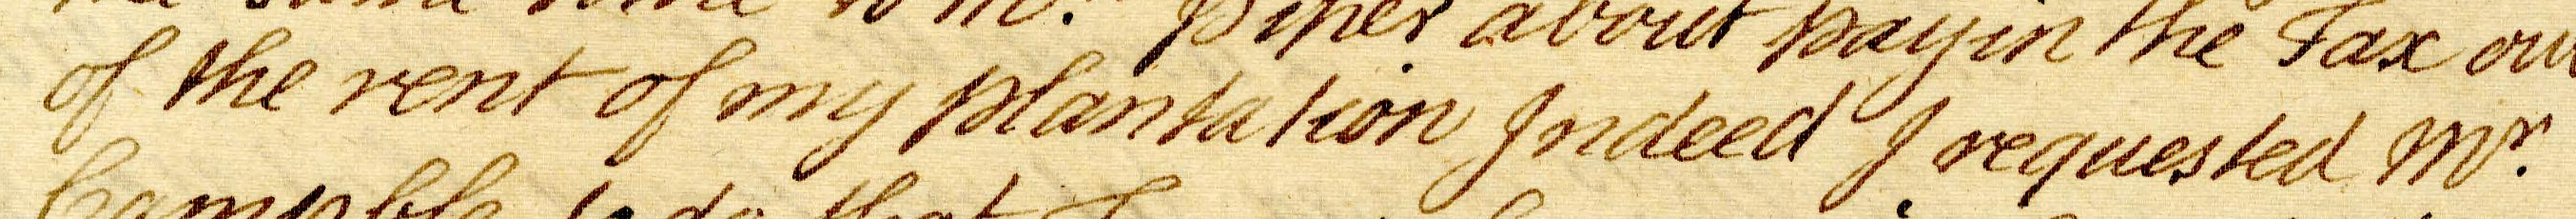of the rent of my plantation Indeed I requested M^r.
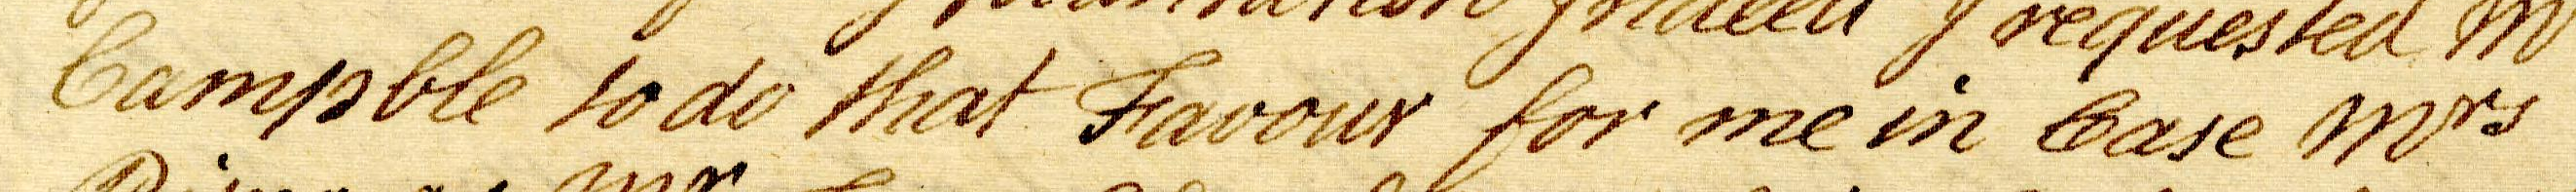Campble to do that Favour for me in Case M^rs
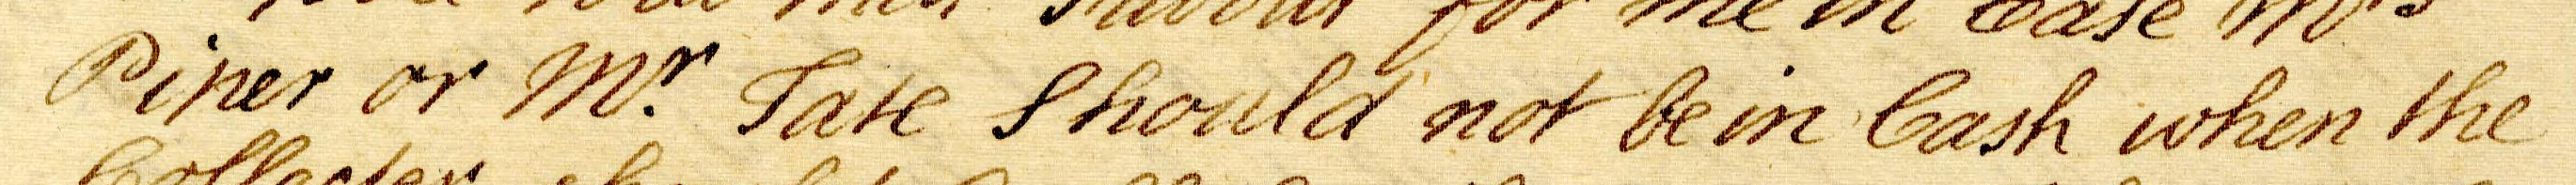Piper or M^r. Tate Should not be in Cash when the
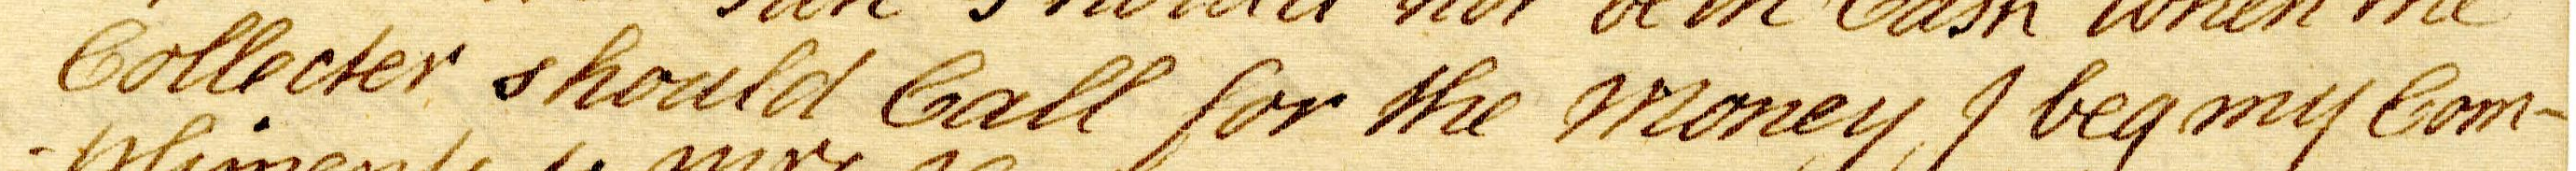Collecter should Call for the Money I beg my Com-
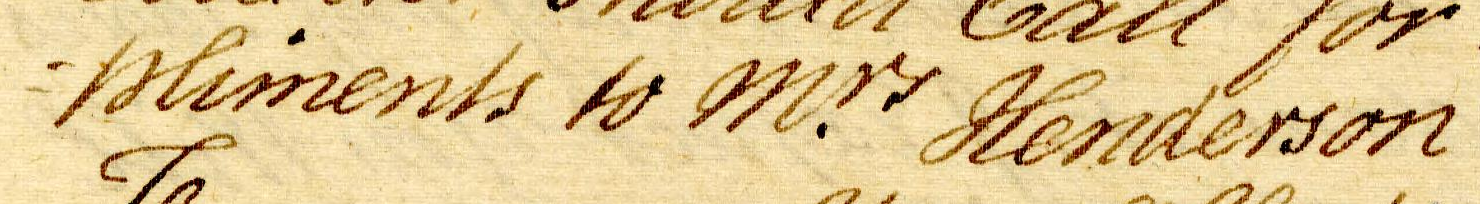-pliments to M^rs. Henderson
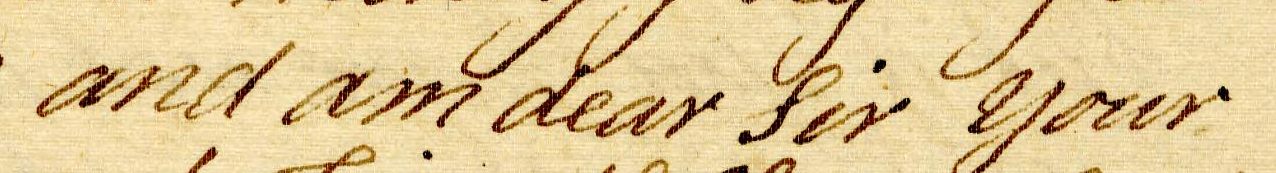and am dear Sir Your
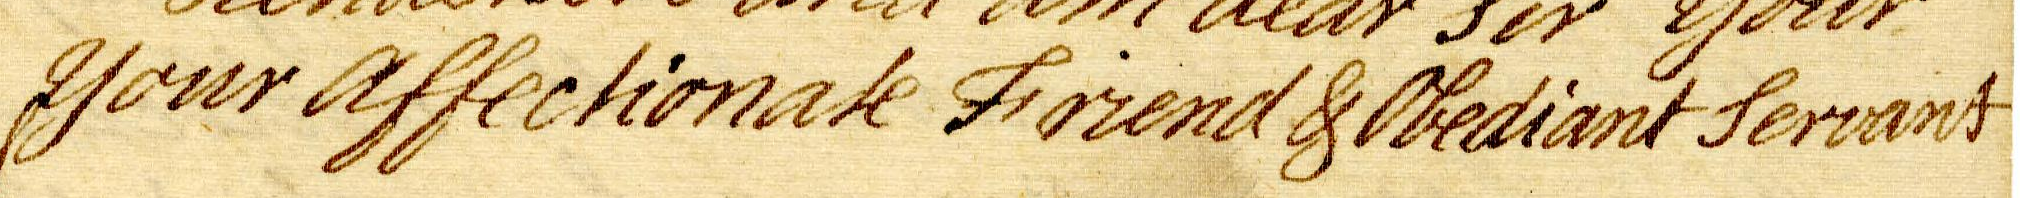Your Affectionate Friend & Obediant Servant
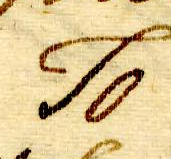To
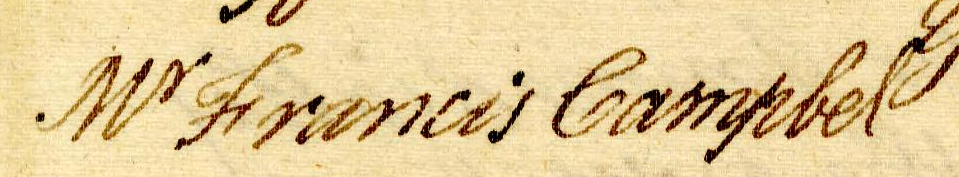M^r Francis Campbel
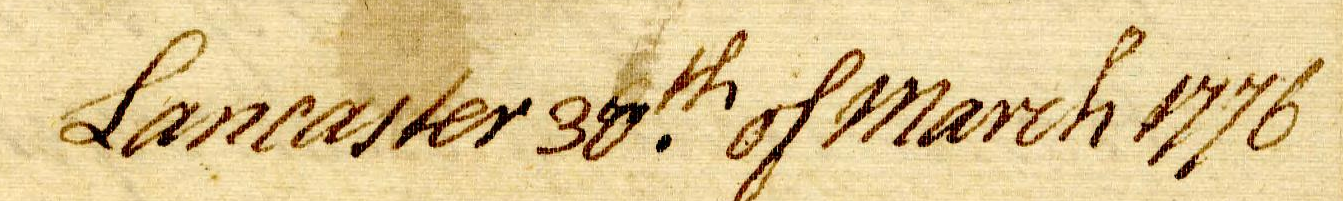Lancaster 30^th. of March 1776
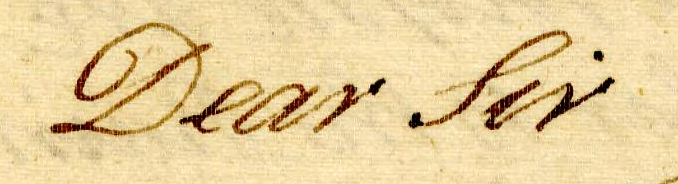Dear Sir
